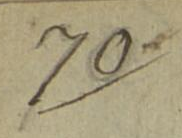70
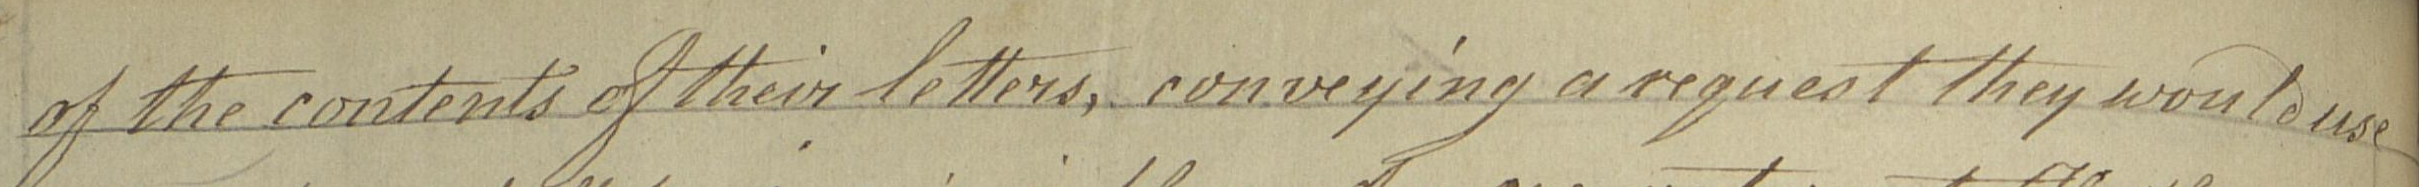of the contents of their letters, conveying a request they would use
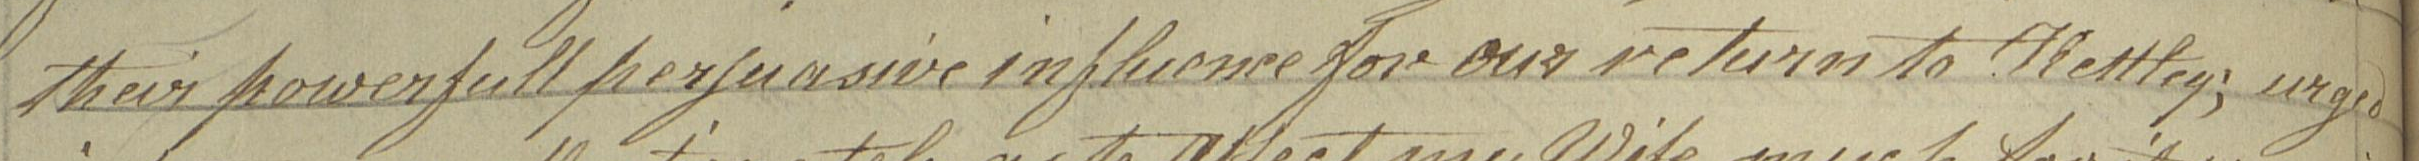their powerfull persuasive influence for our return to Hettley; urged
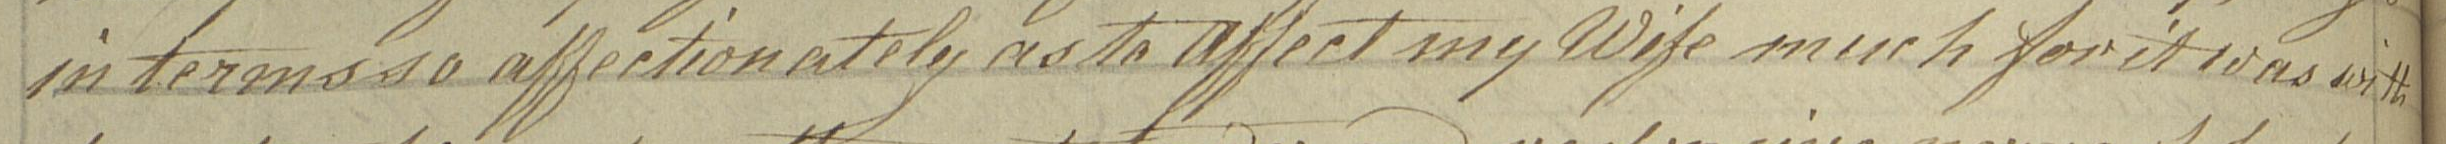interims so affectionately as to Affect my Wife much for it was with
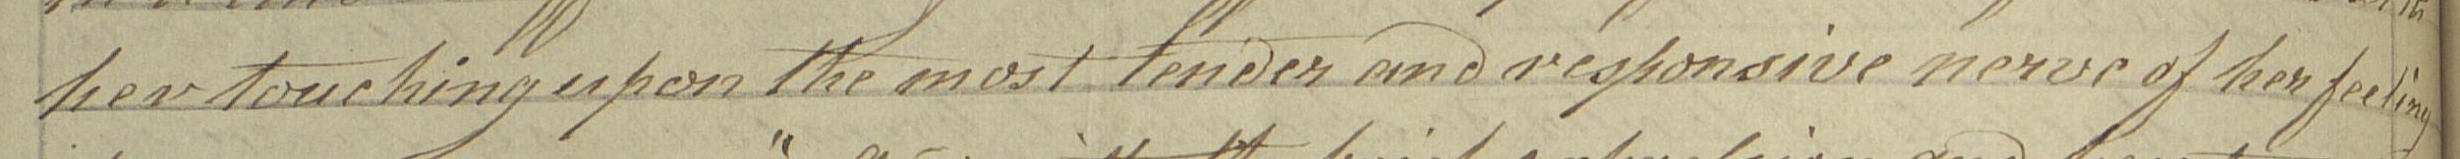her touching upon the most tender and responsive nerve of her feeling
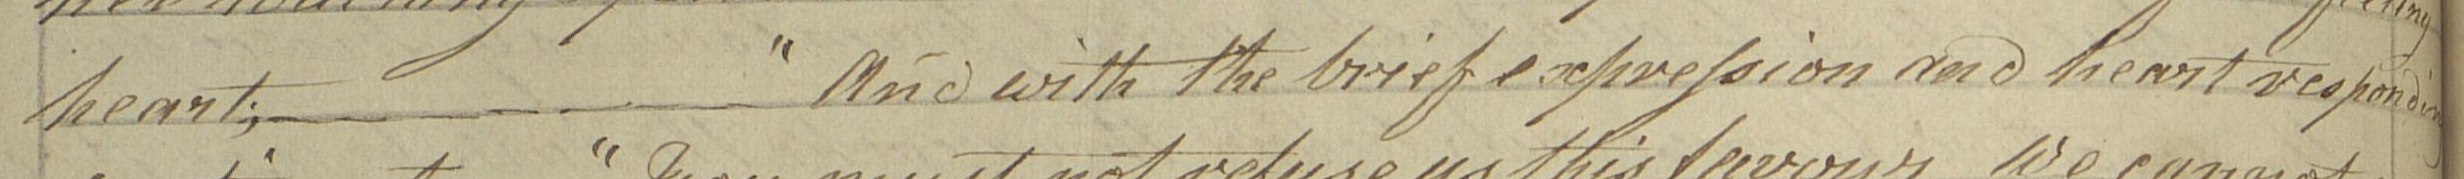heart; "And with the brief expression and heart responding
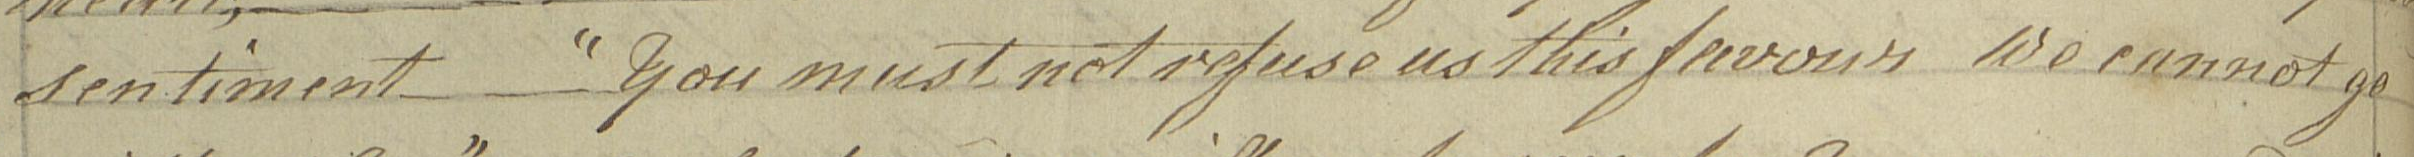sentiment "You must not refuse us this favour We cannot go
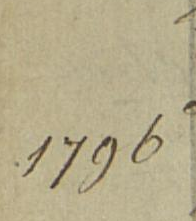1796
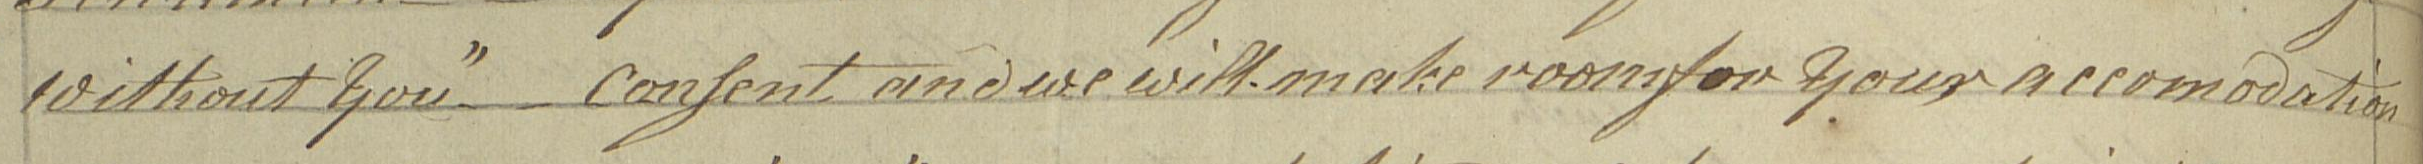without you." Consent and we will make room for your accomodation
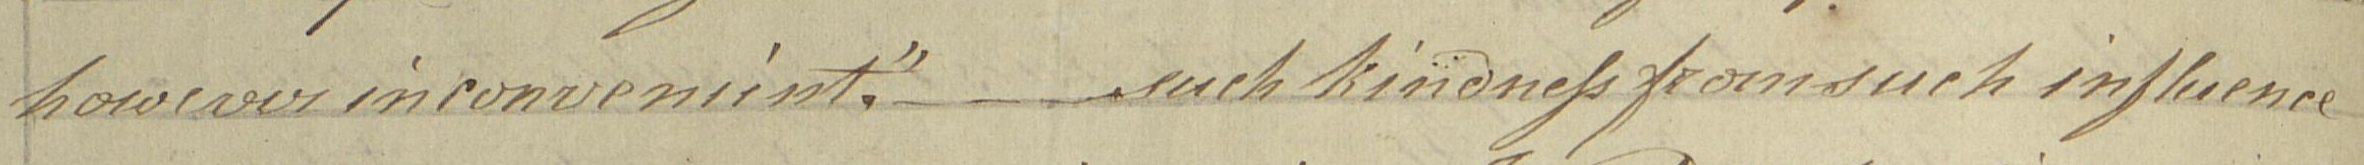however inconvenient." such kindness from such influence
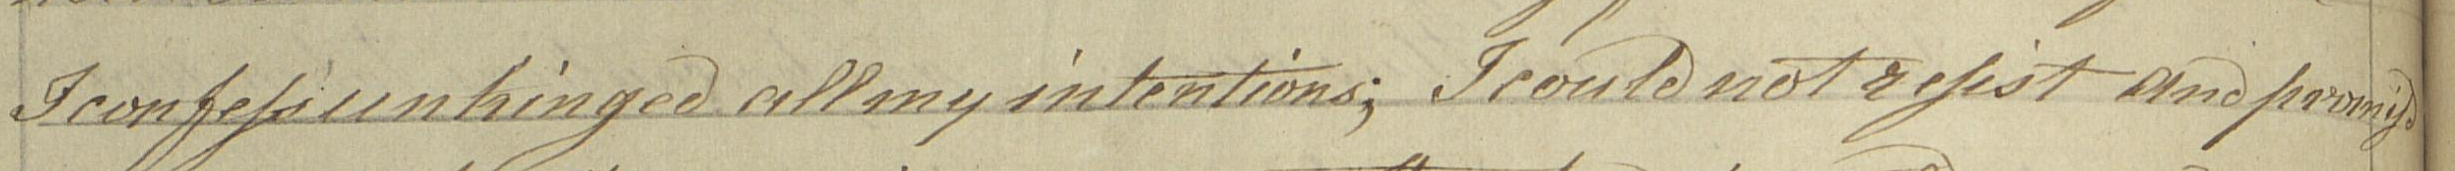I confess unhinged all my intentions; I could not resist And promisd
